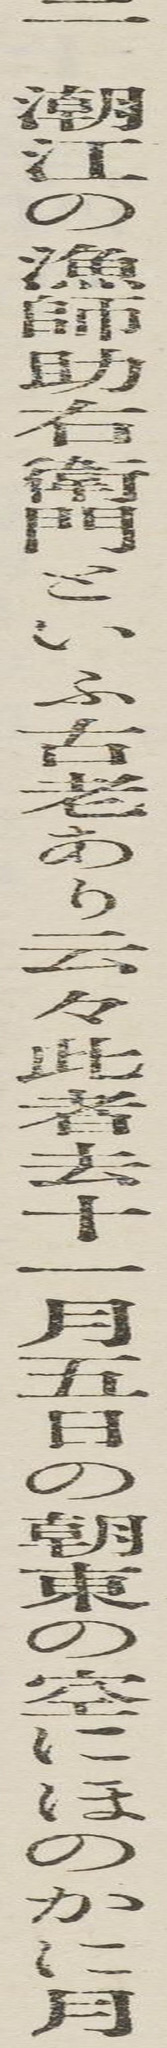㈢潮江の漁師助右衛門といふ古老あり云々此者去十一月五日の朝東の空にほのかに月
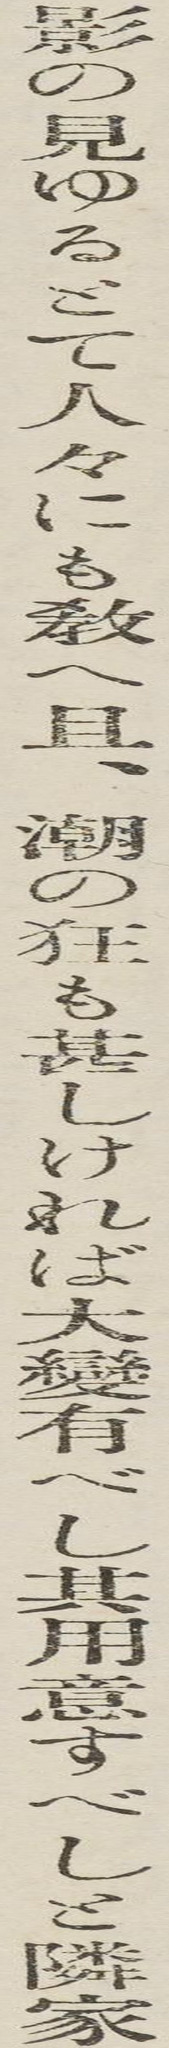影の見ゆるとて人々にも教へ且、潮の狂も甚しければ大変有べし其用意すべしと隣家
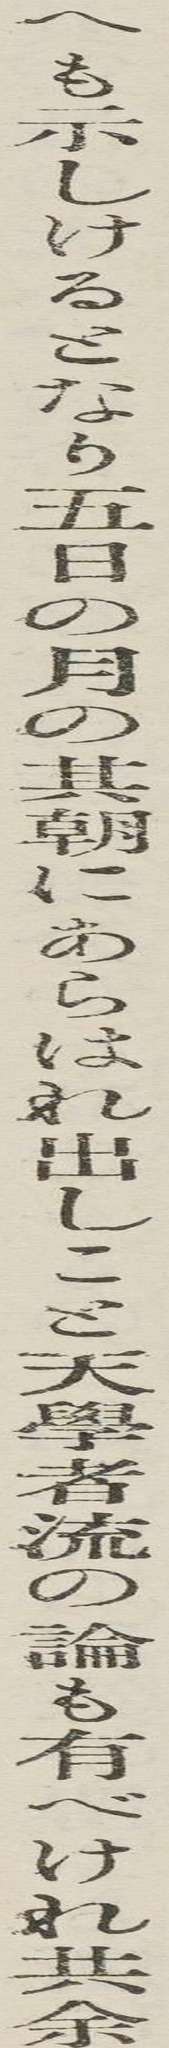へも示しけるとなり五日の月の其朝にあらはれ出しこと天学者流の論も有べけれ共余
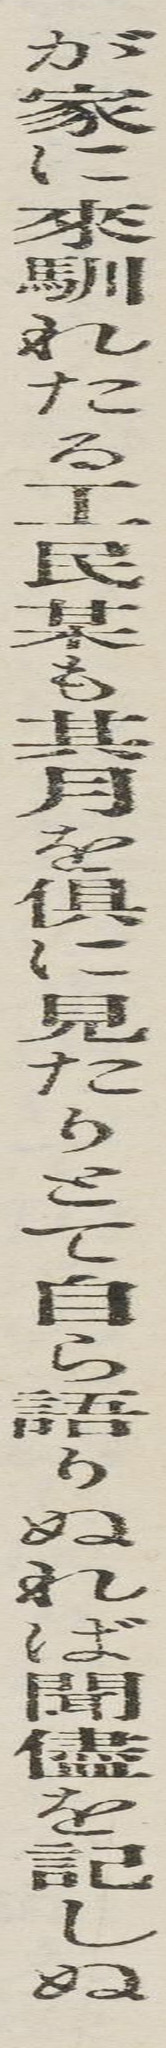が家に来馴れたる工民某も其月を倶に見たりとて自ら語りぬれば聞侭を記しぬ
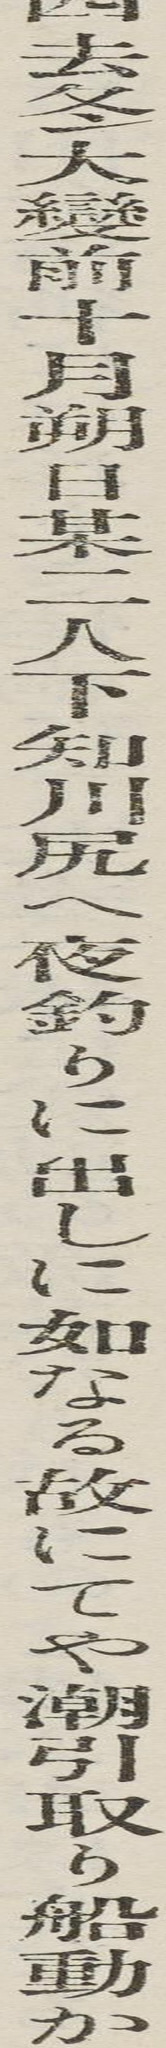㈣去冬大変前十月朔日某二人下知川尻へ夜釣りに出しに如なる故にてや潮引取り船動か
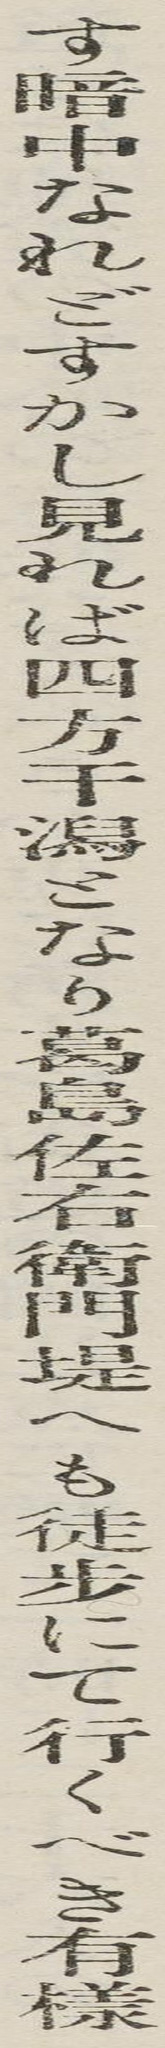す暗中なれどすかし見れば四方干潟となり葛島佐右衛門堤へも徒歩にて行くべき有様
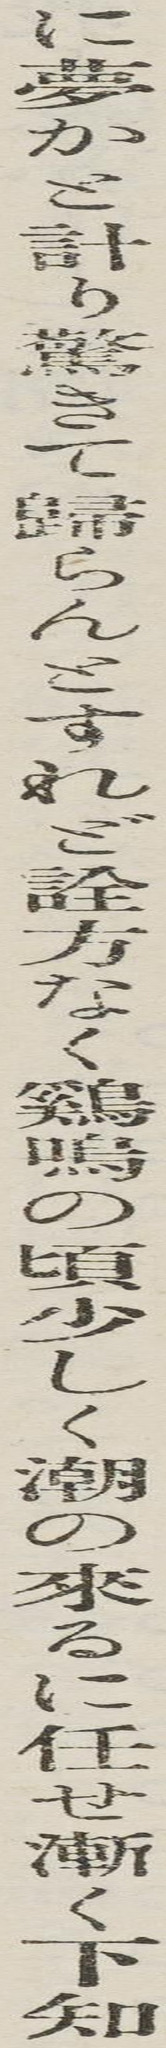に夢かと計り驚きて帰らんとすれど詮方なく鷄鳴の頃少しく潮の来るに任せ漸く下知
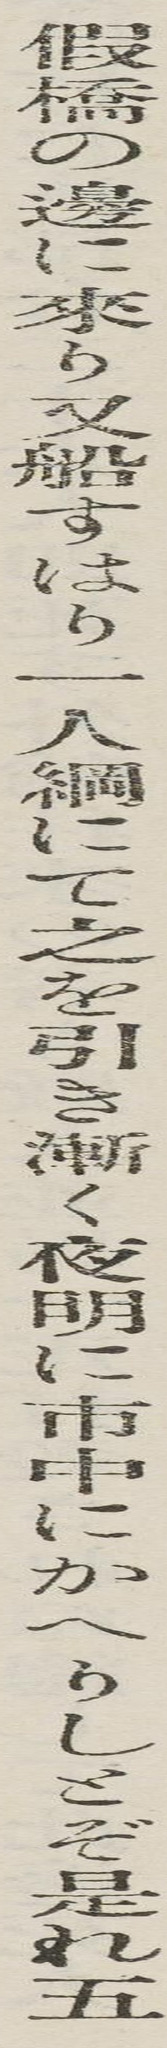仮端の辺に来り又船すはり一人綱にて之を引き漸く夜明に市中にかへりしとぞ是れ五
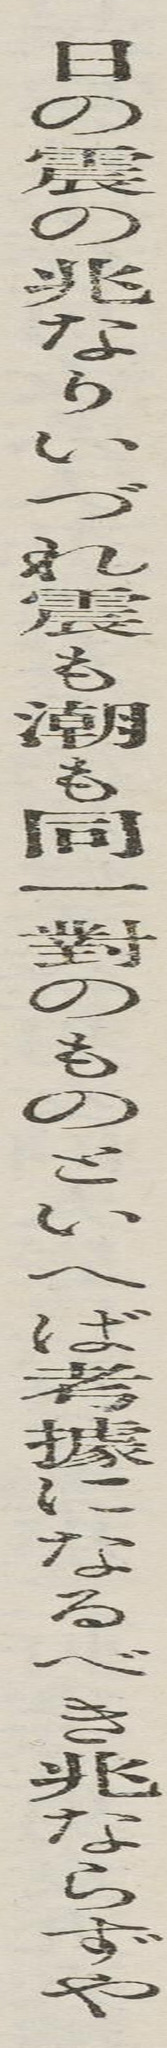日の震の兆なりいづれ震も潮も同一対のものといへば考拠になるべき兆ならずや
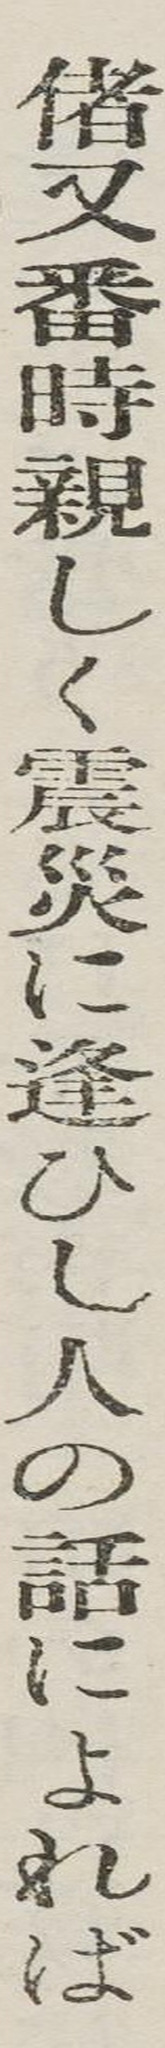偖又番時親しく震災に逢ひし人の話によれば
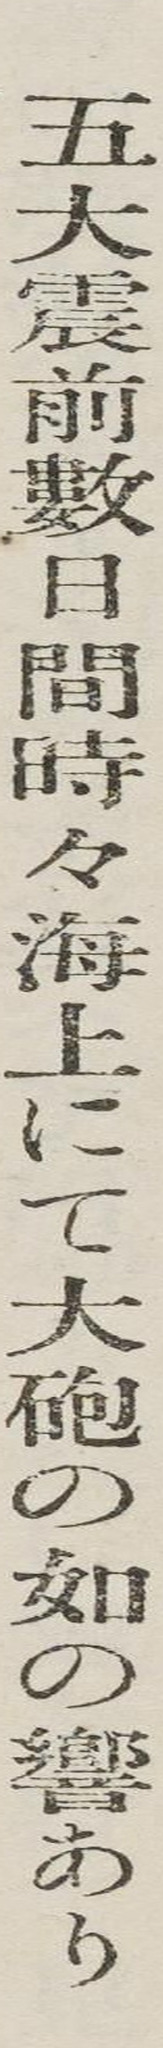㈤大震前数日間時々海上にて大砲の如の響あり
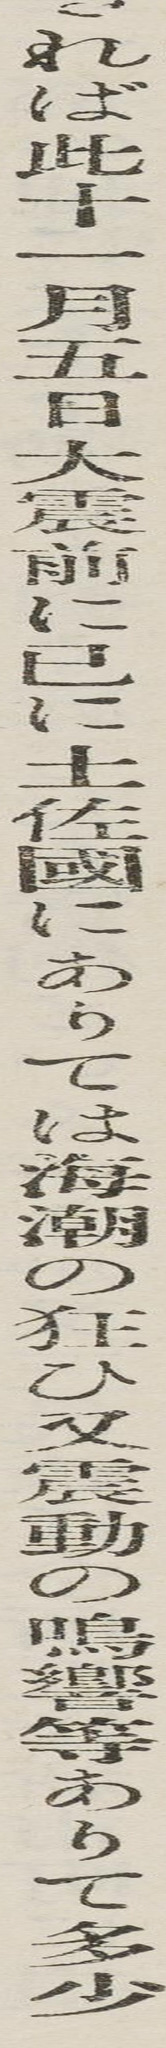されば此十一月五日大震前に已に土佐国にありては海潮の狂ひ又震動の鳴響等ありて多少
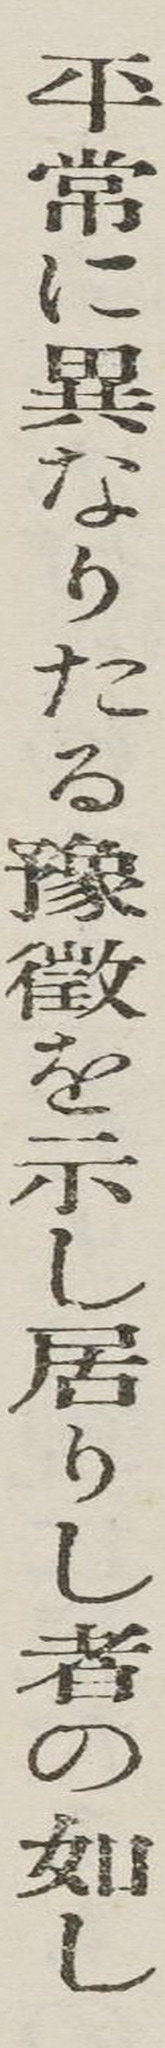平常に異なりたる予徴を示し居りし者の如し
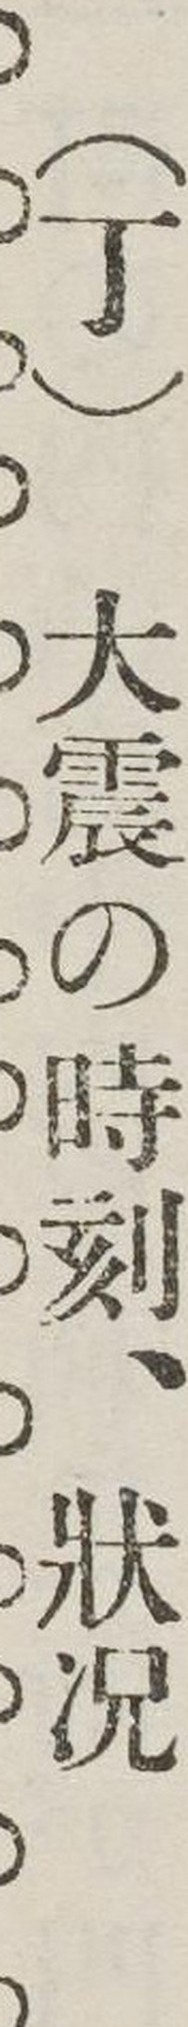大震の時刻、状况
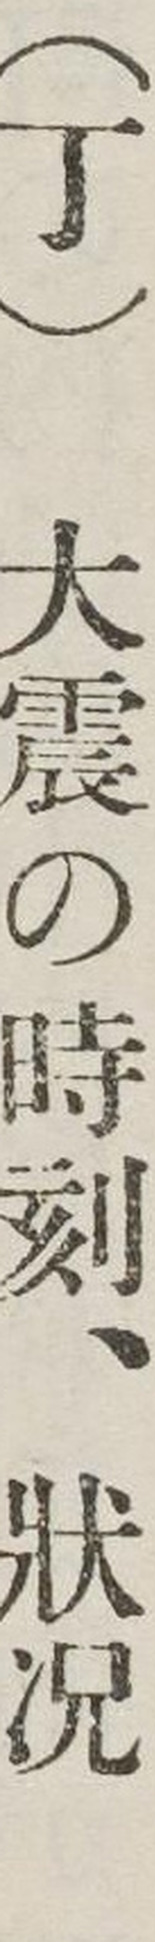大震の時刻、状况
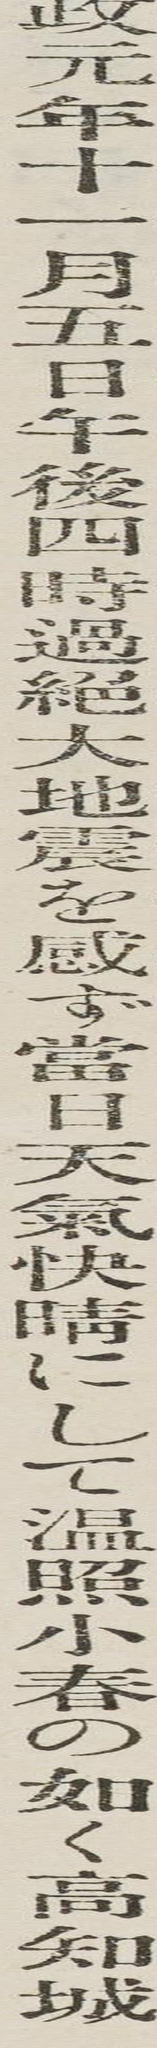安政元年十一月五日午後四時過絶大地震を感ず当日天気快晴にして温照小春の如く高知城
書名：土佐古今ノ地震
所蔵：東京大学地震研究所図書室 Earthquake Research Institute Library, The University of Tokyo, JAPAN
